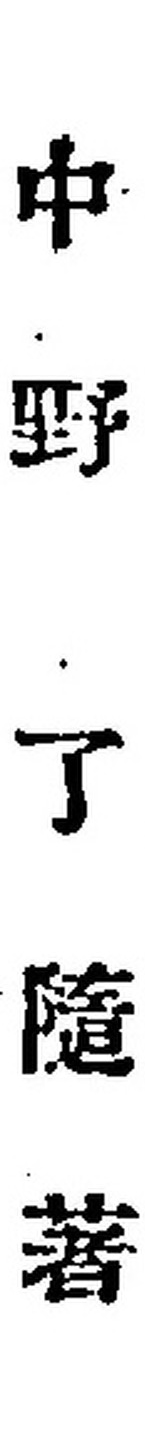中野了随著
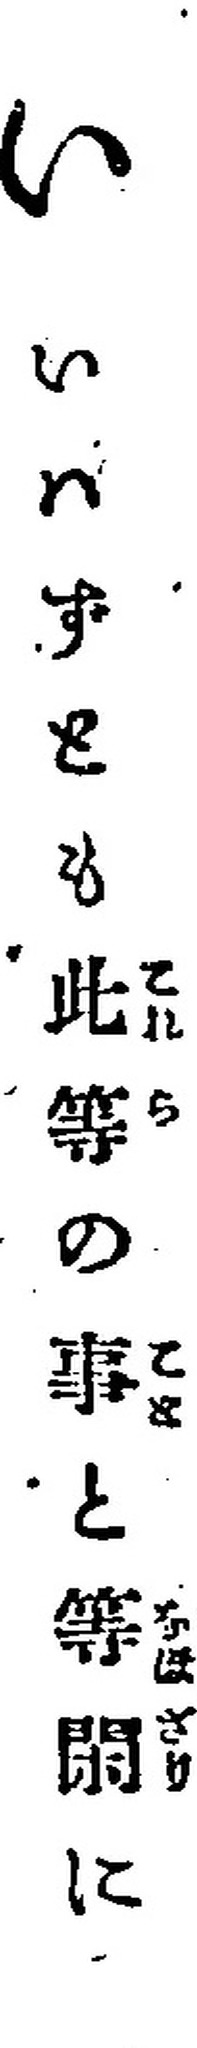いいはずとも此等の事と等閑に
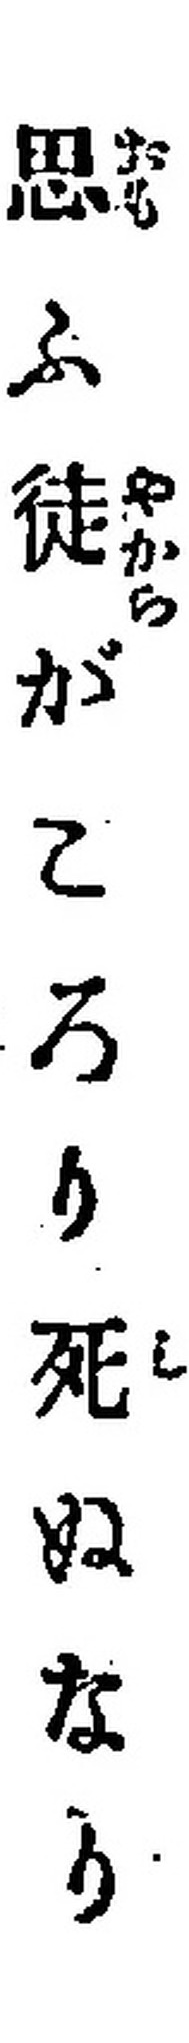思ふ徒がころり死ぬなり
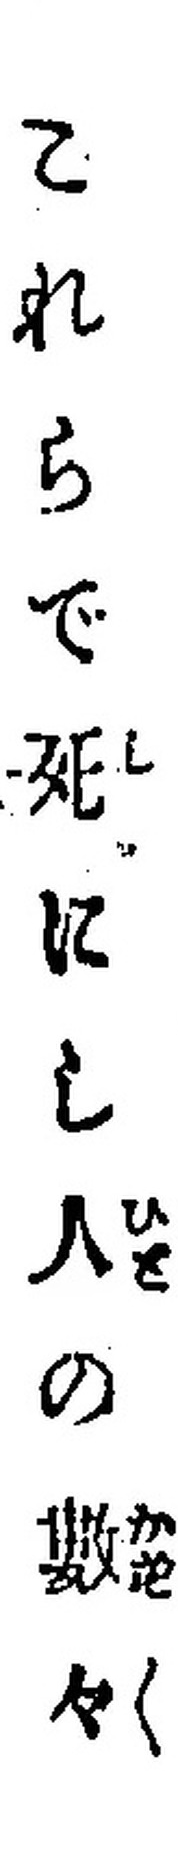これらで死にし人の數々
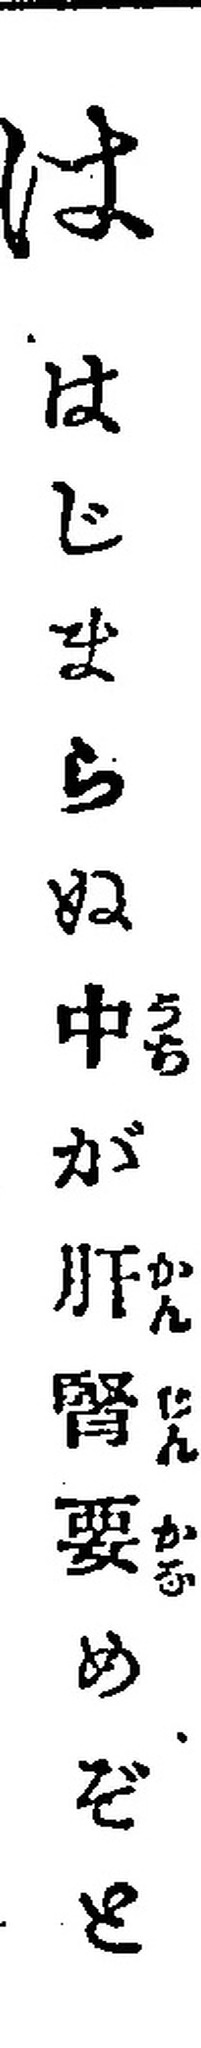ははじまらぬ中が肝腎要めぞと
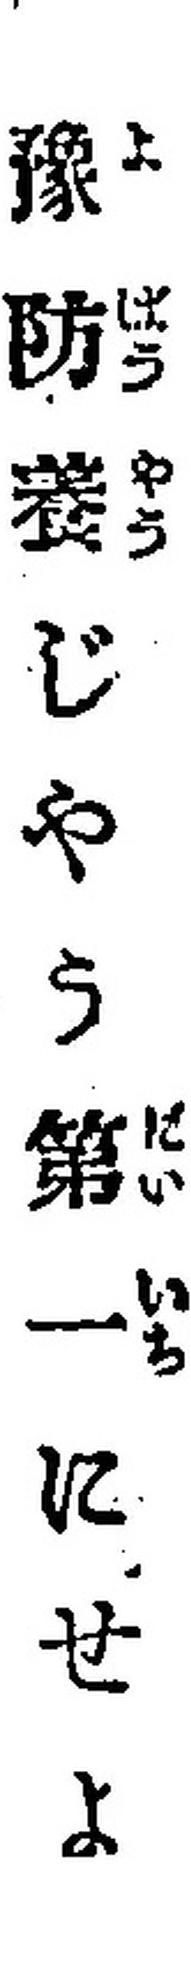豫防養じやう第一にせよ
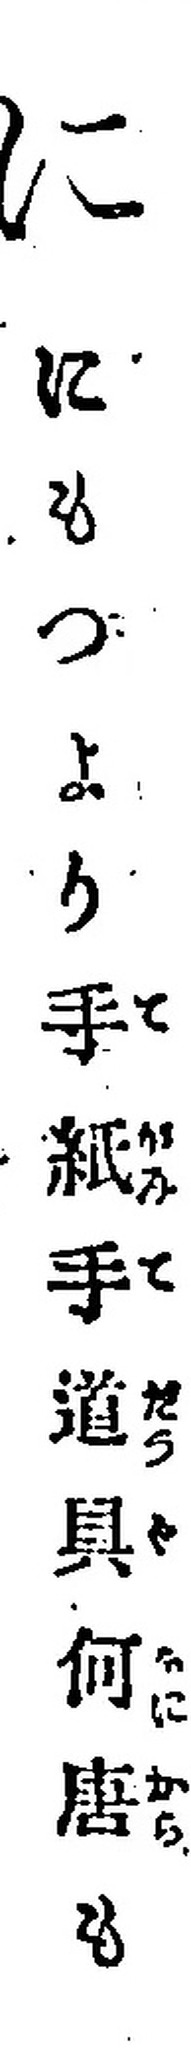ににもつより手紙手道具何唐も
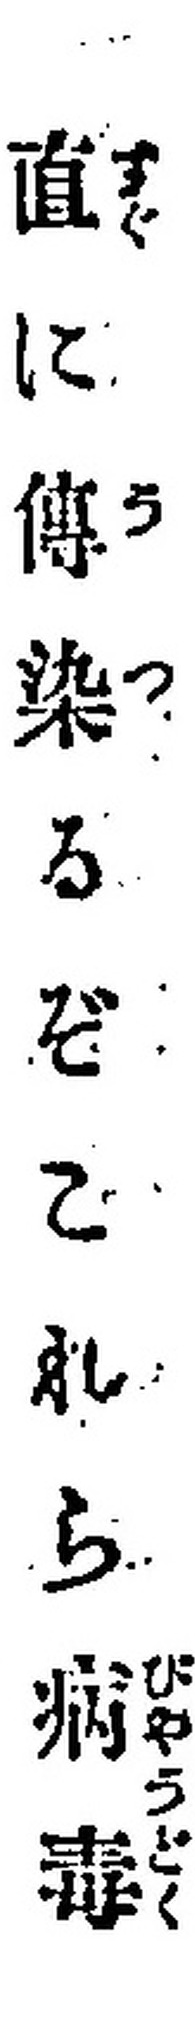直に傳染るぞこれら病毒

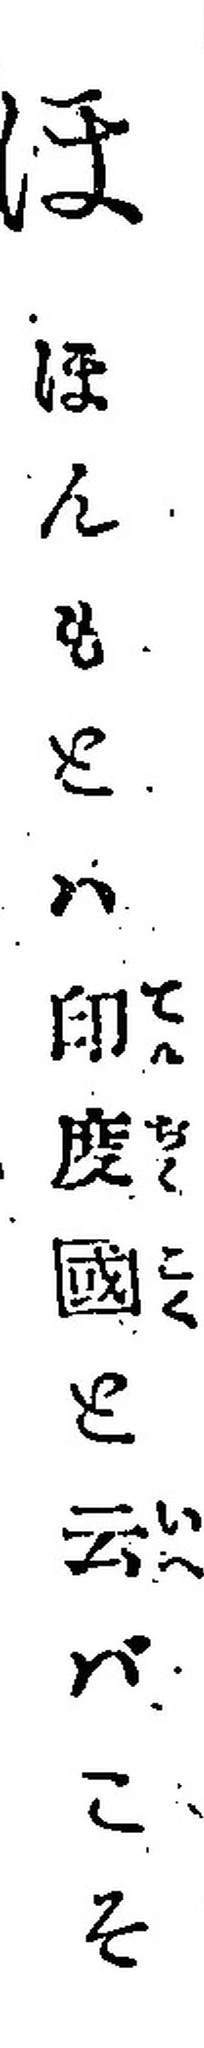ほほんもとは印度國と云はこそ
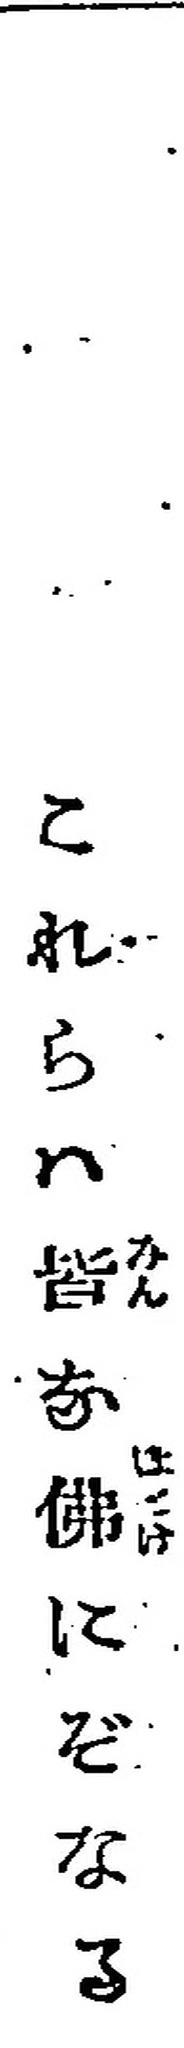これらは皆な佛にぞなる
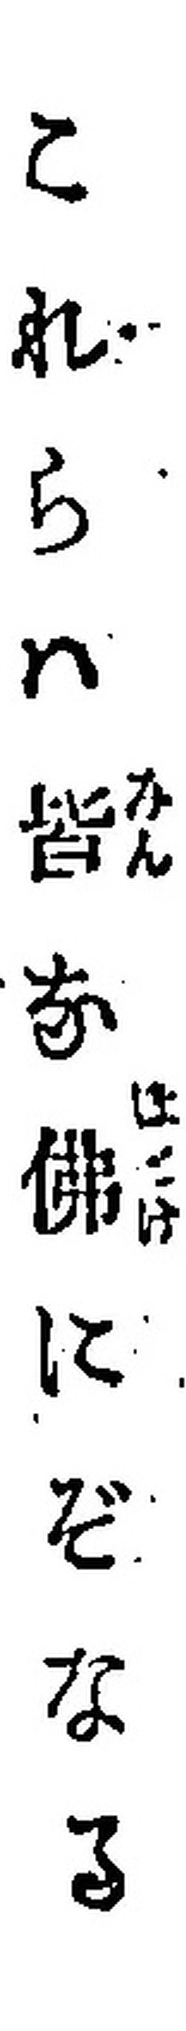これらは皆な佛にぞなる
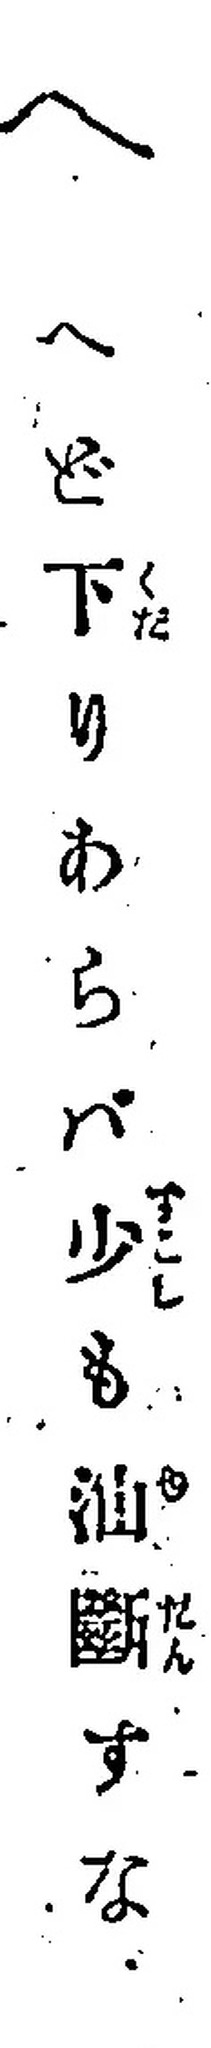へへど下りあらば少も油断すな
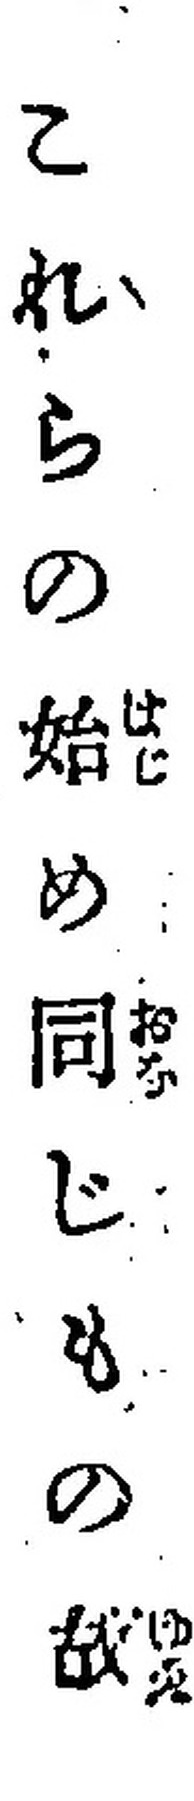これらの始め同じもの故
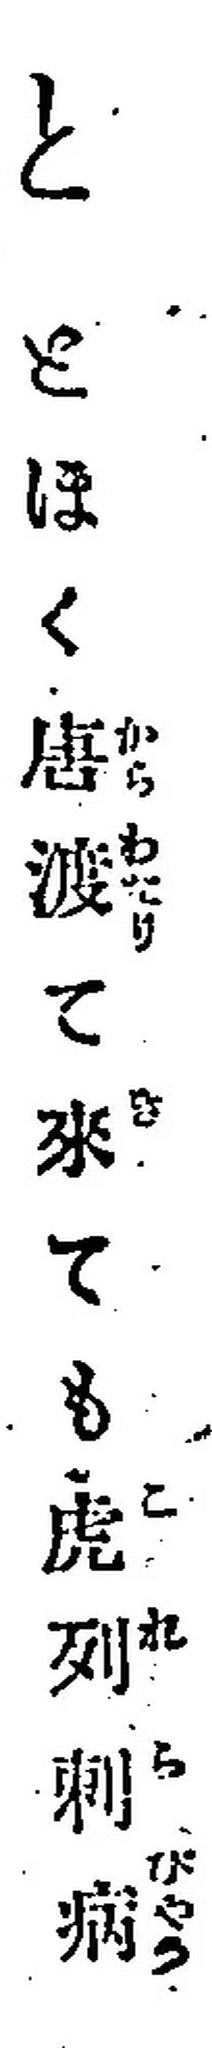ととほく唐渡て來ても虎列刺病
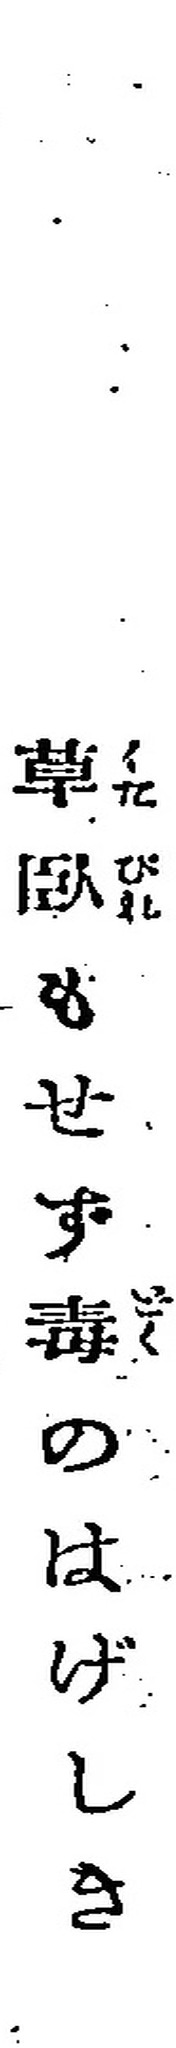草臥もせず毒のはげしき
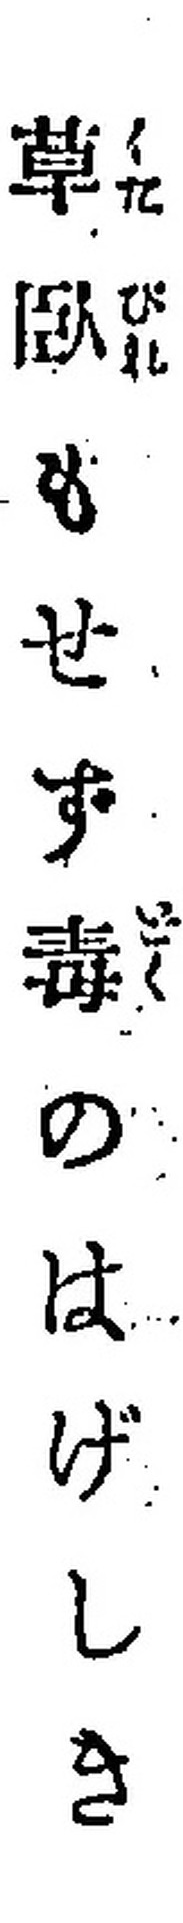草臥もせず毒のはげしき
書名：新撰暑中養生法 : 附・コレラ予防歌
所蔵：国立国会図書館 National Diet Library, JAPAN
